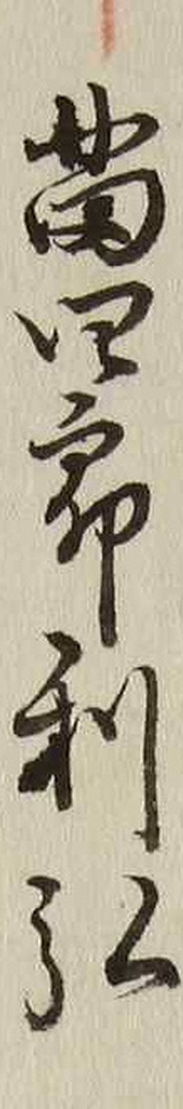留四郎利弘
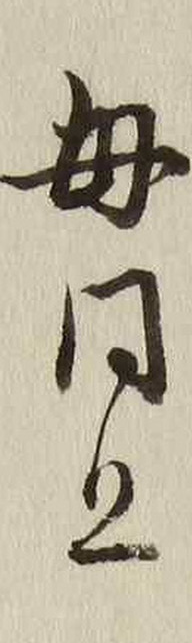母同上
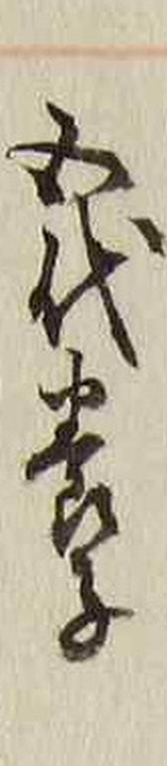五代養子
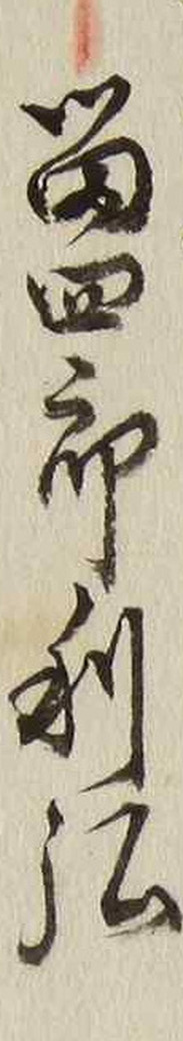留四郎利弘
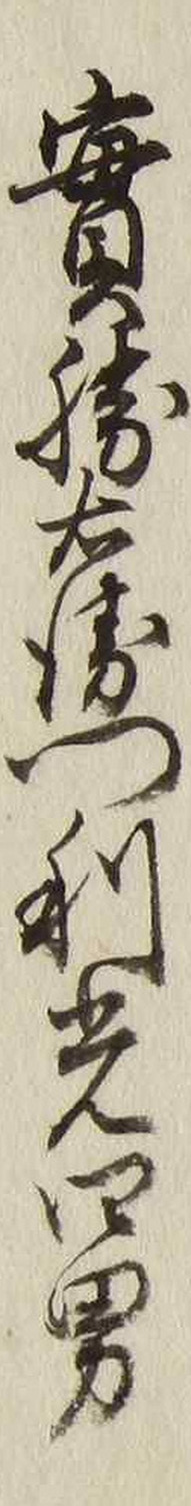実勝右衛門利光四男

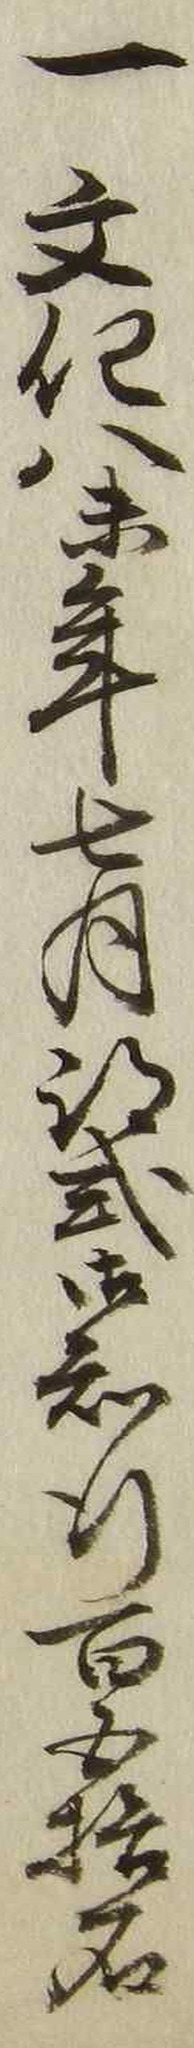一文化八未年七月跡弐御知行百五拾石
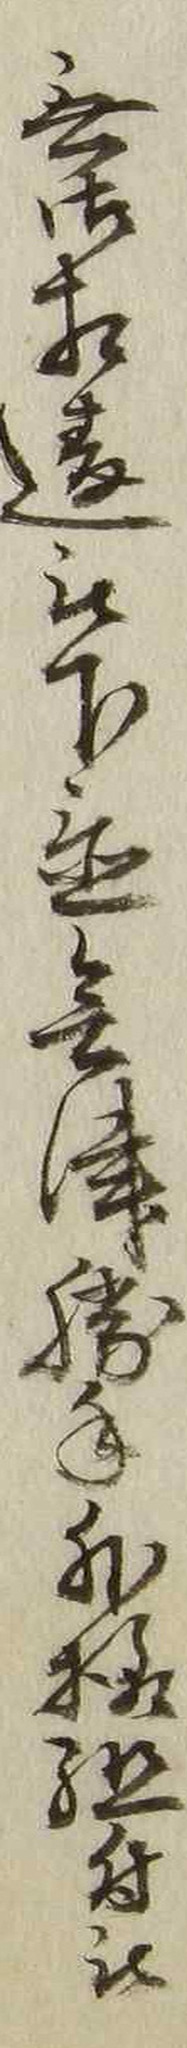無御相違被下置会津勝手外様組付被
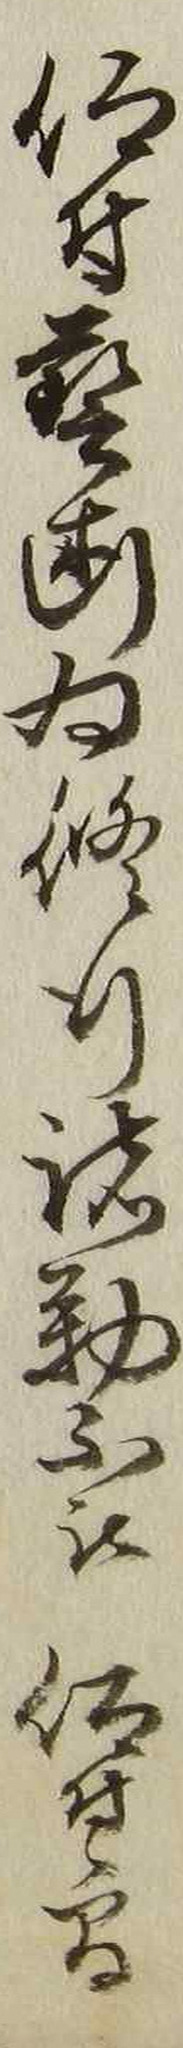仰付芸術為修行諸勤不被仰付候間
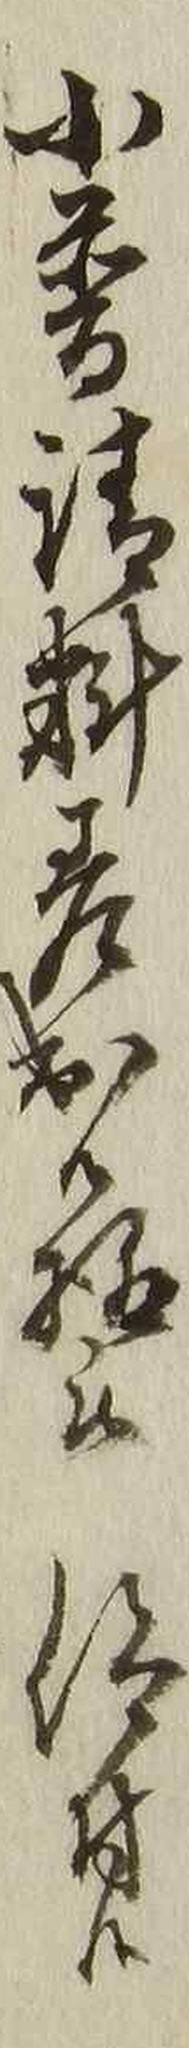小普請料差出候様被仰付候
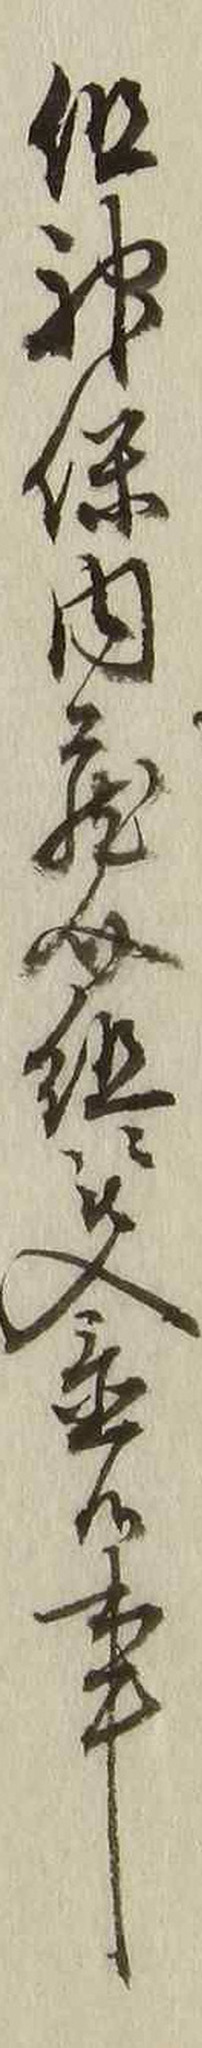但神保内蔵介組ニ被入置候事
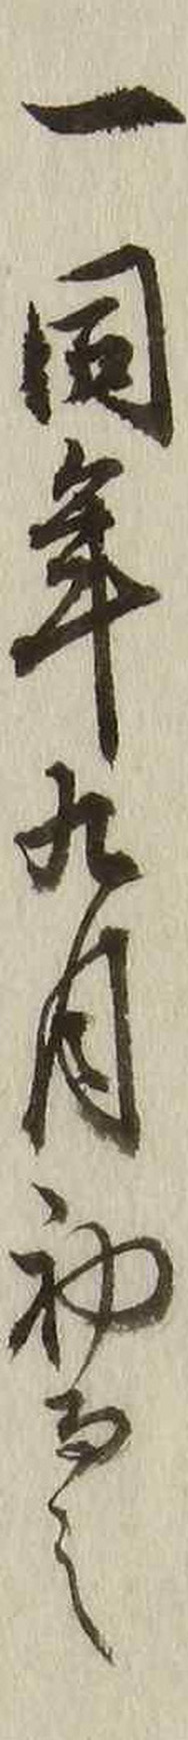一同年九月初而之
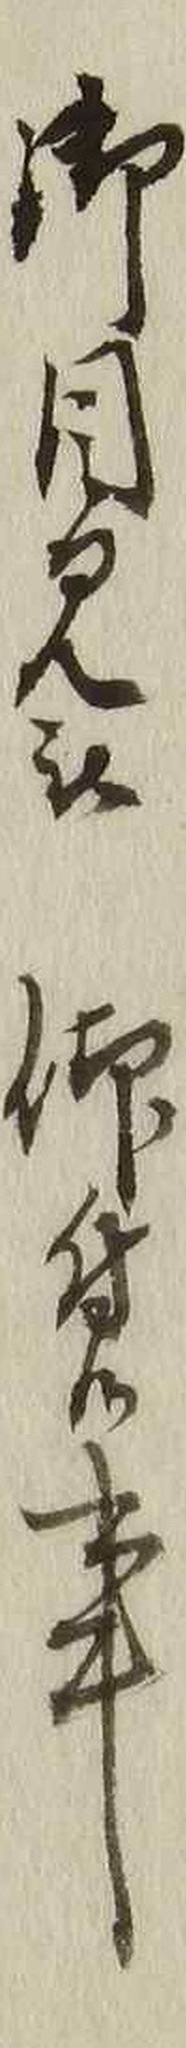御目見被仰付候事
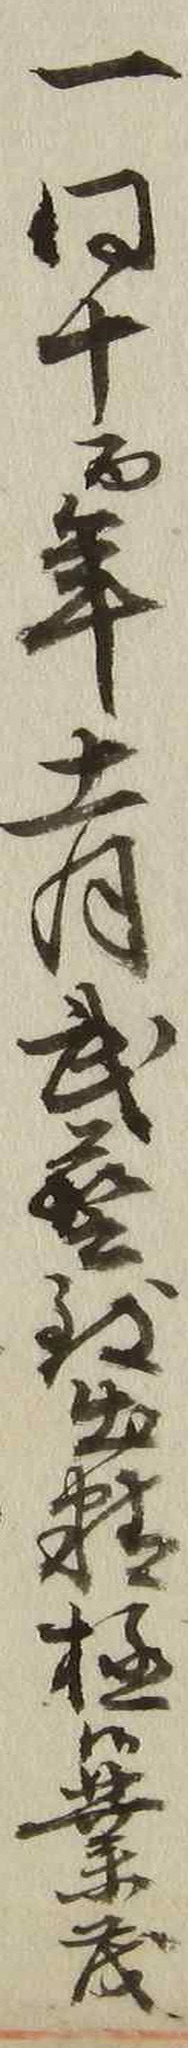一同十酉年十一月武芸致出精極候業茂
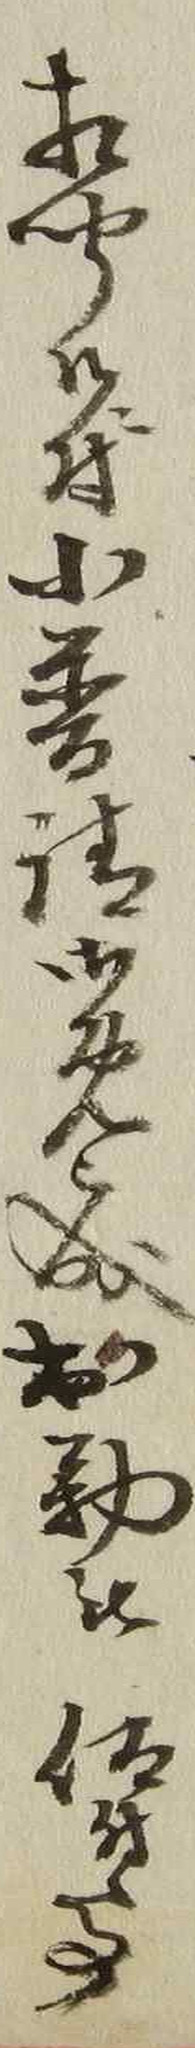相聞御ニ付小普請御免被成出勤被仰付候事
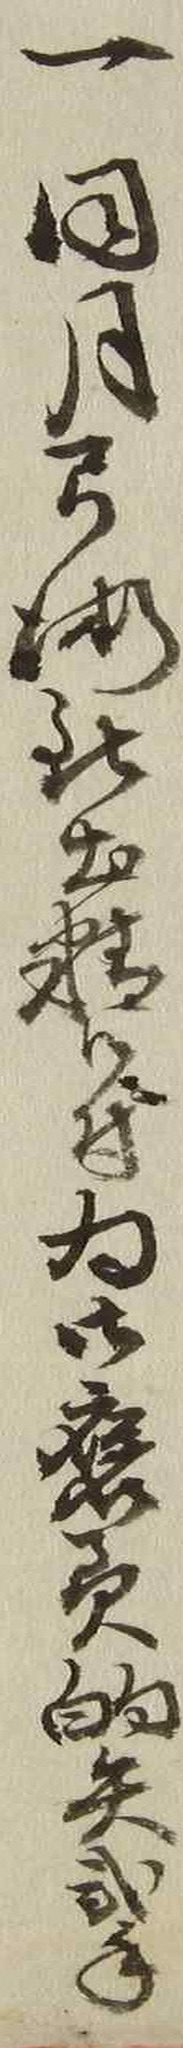一同月弓術致出精候ニ付為御褒美的矢弐手
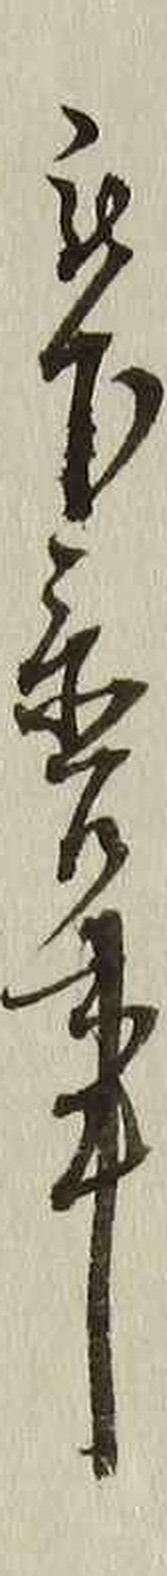被下置候事
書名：諸士系譜　巻之23　い之部23
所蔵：会津若松市立会津図書館
